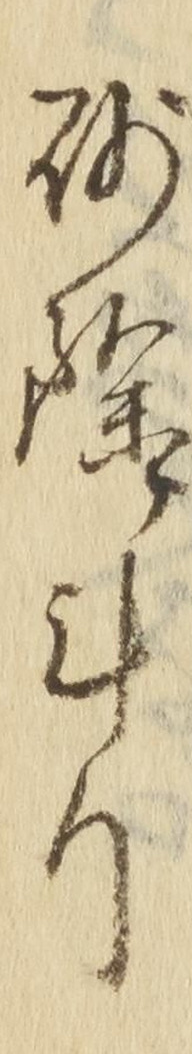砂除斗り

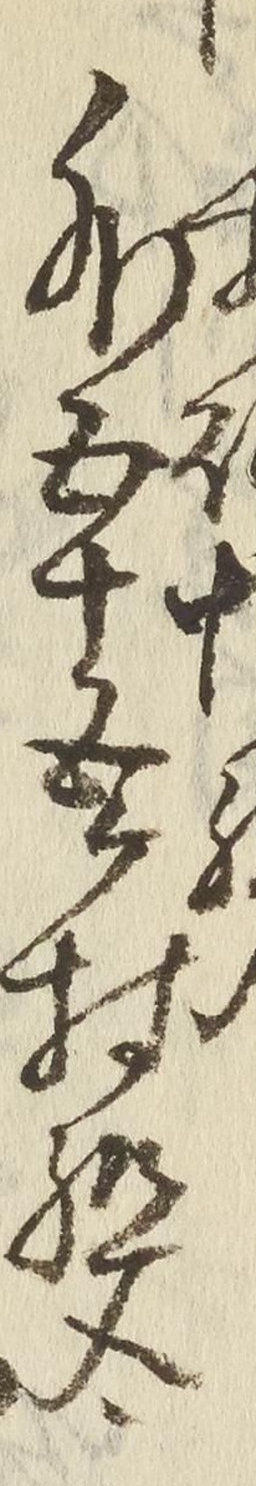外五十五ケ村組合
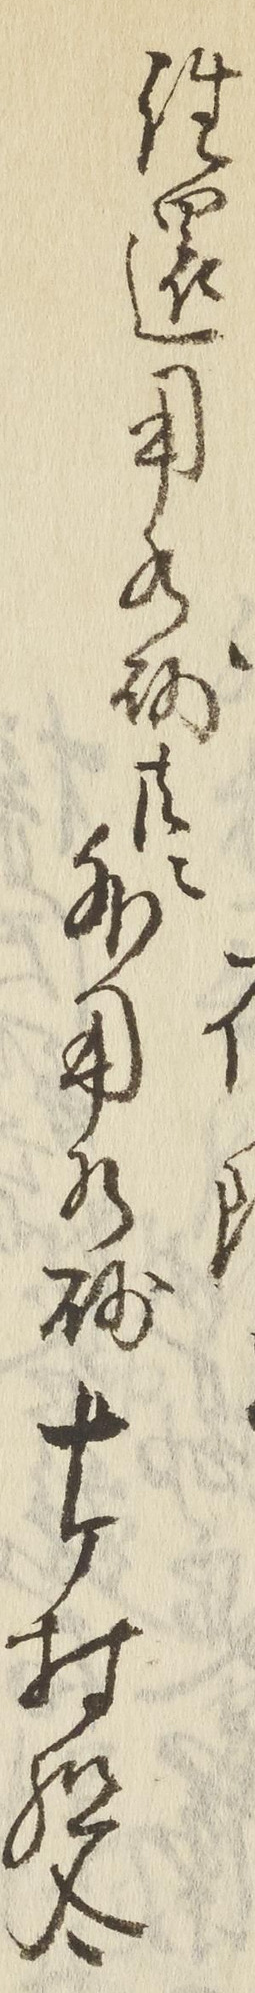往還用水砂共二外用水砂十ケ村組合
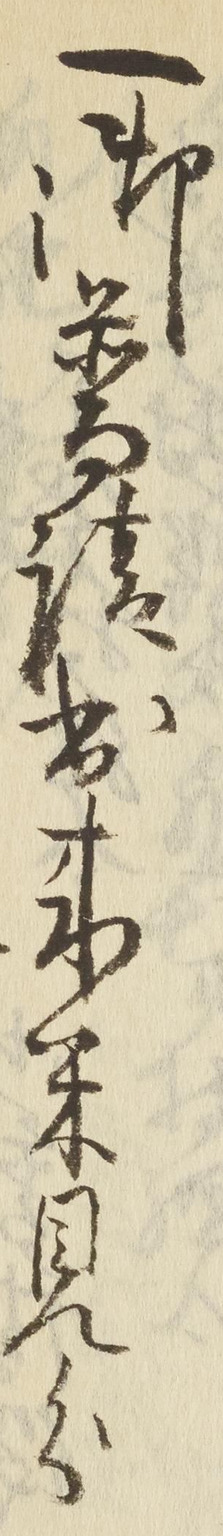一御普請出来未見分
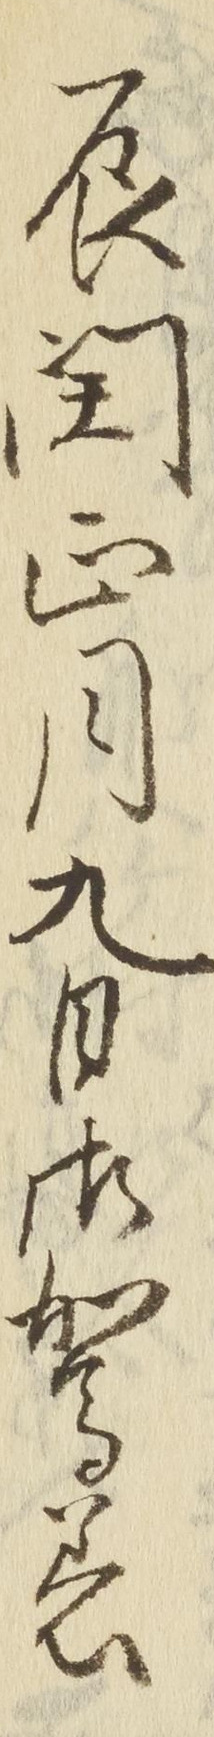辰閏正月九日御駕着
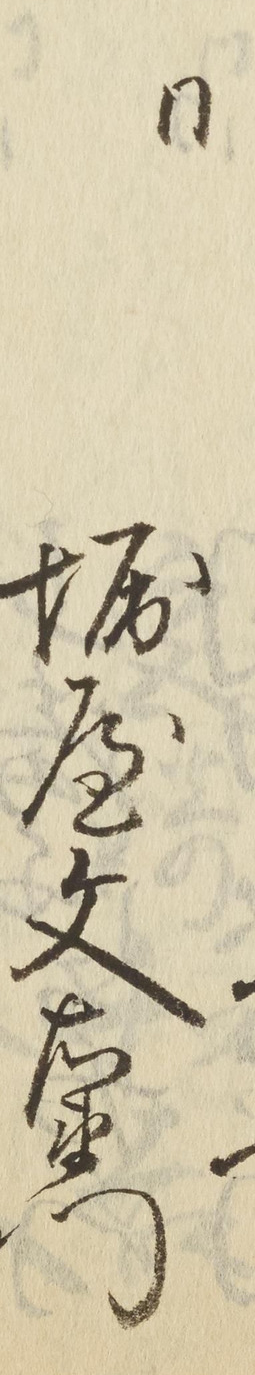同堀屋文右衛門
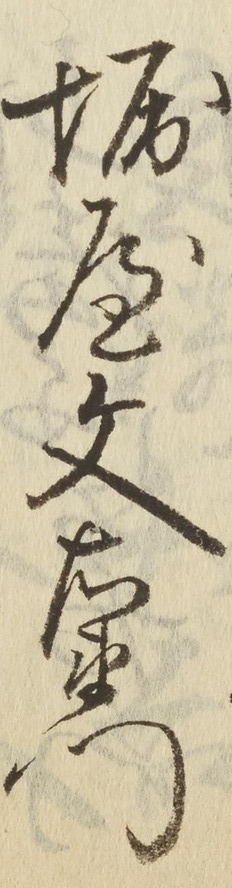同堀屋文右衛門
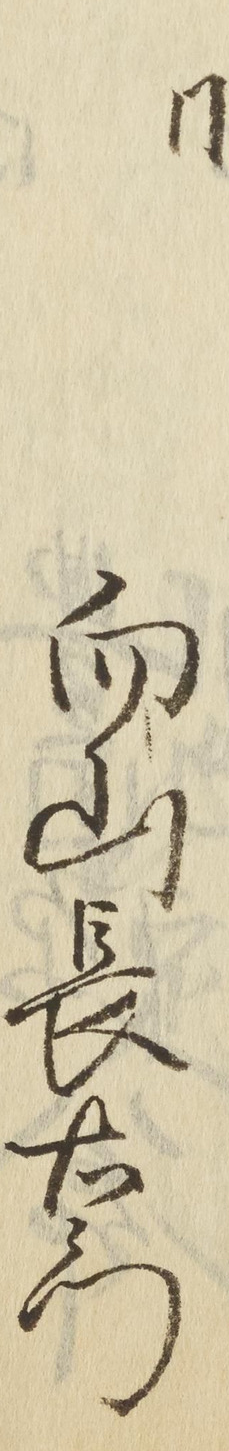同向山長右衛門
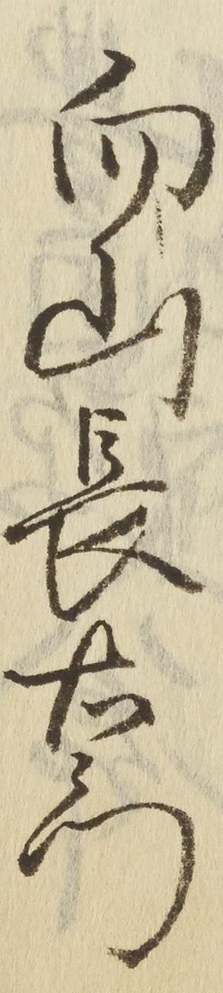同向山長右衛門
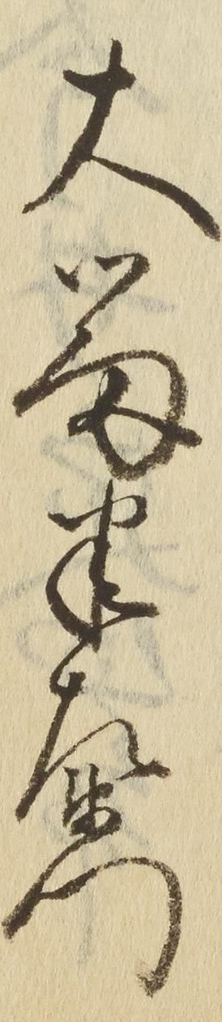同大留半左衛門

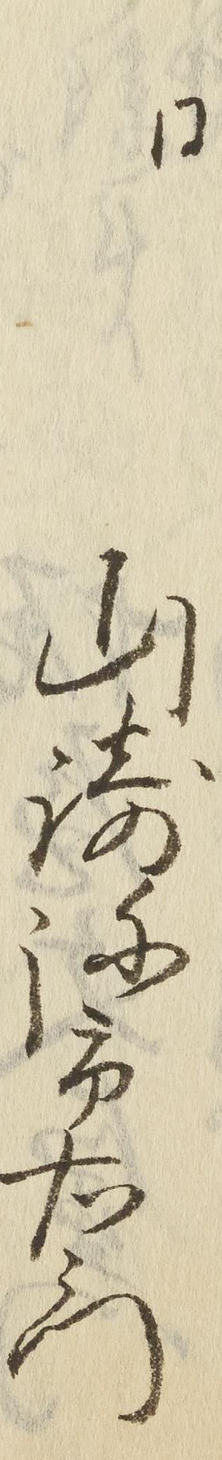同山崎弥市右衛門
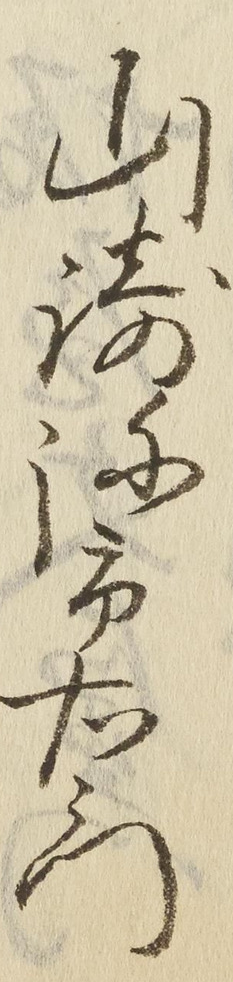同山崎弥市右衛門
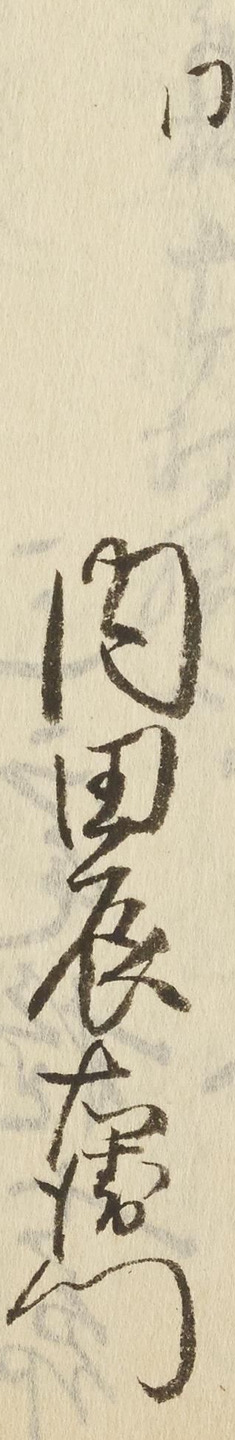同内田辰右衛門
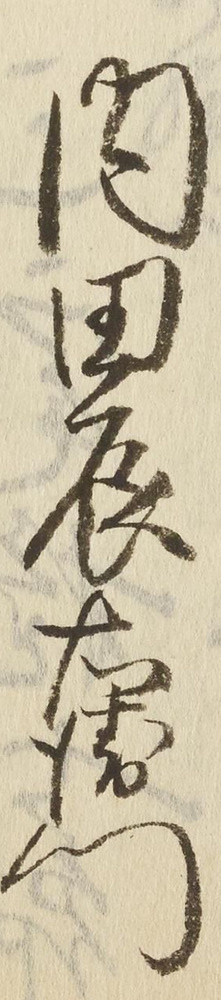同内田辰右衛門
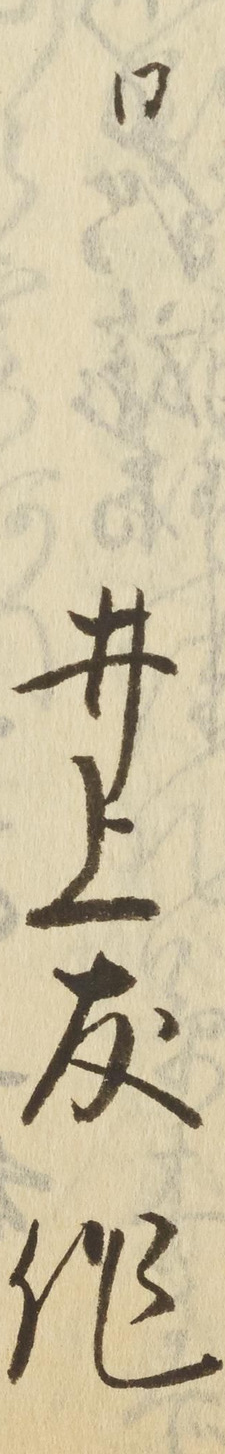同井上友作
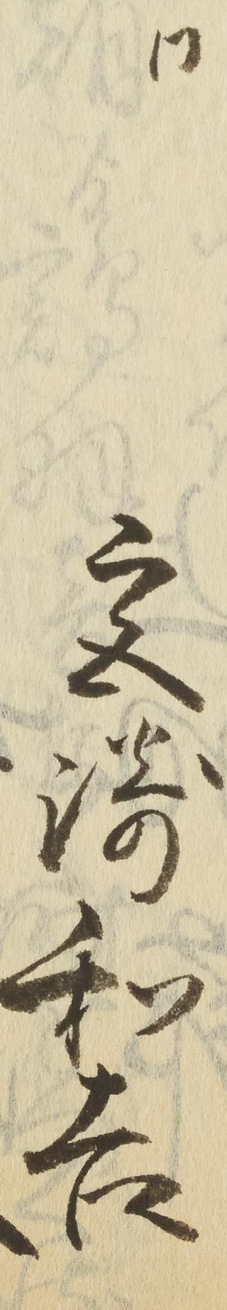同宮崎和吉
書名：浅間大變記
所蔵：東京大学地震研究所図書室 Earthquake Research Institute Library, The University of Tokyo, JAPAN
